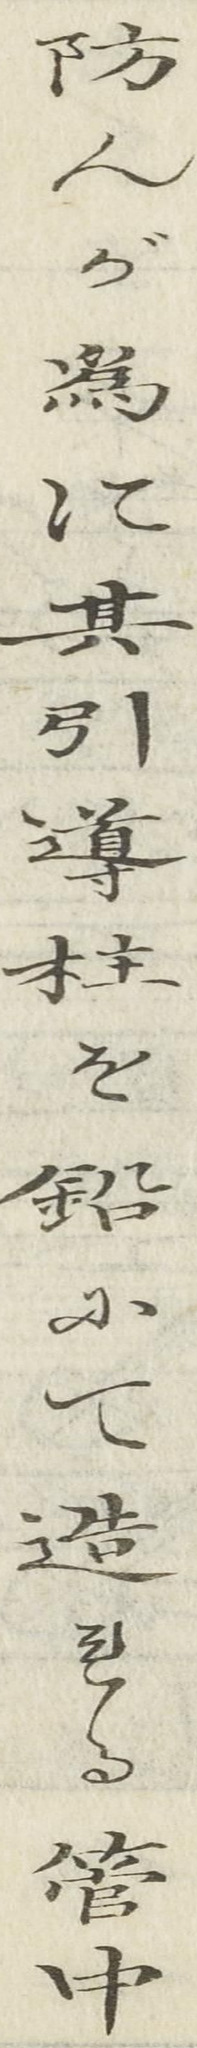防んが為に其引導柱を鉛にて造れる管中
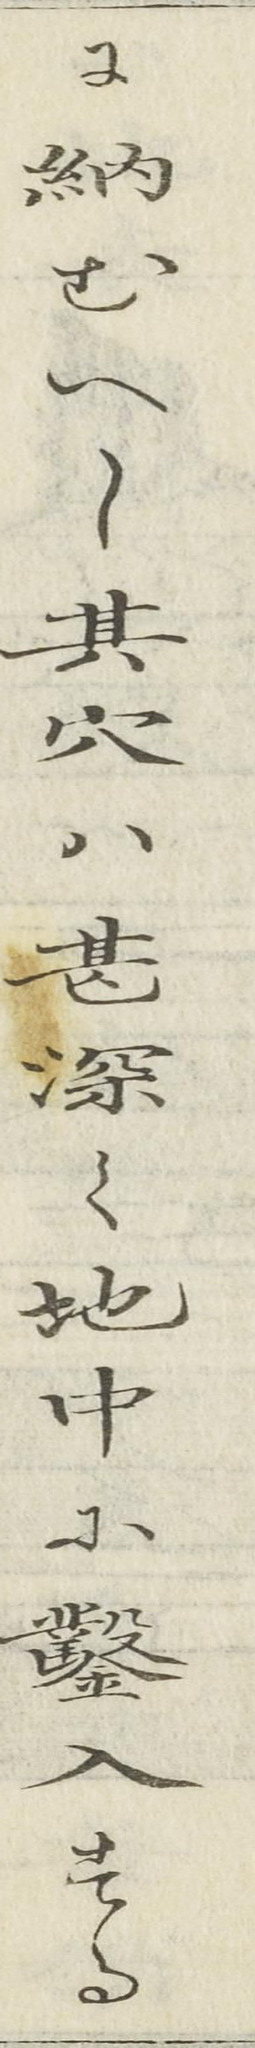に納むへし其穴は甚深く地中に鑿入する
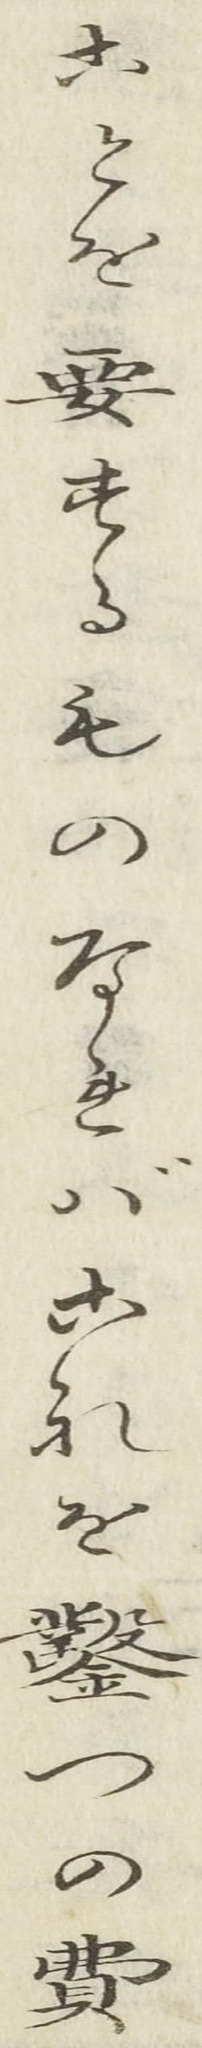ことを要するものなればこれを鑿つの費
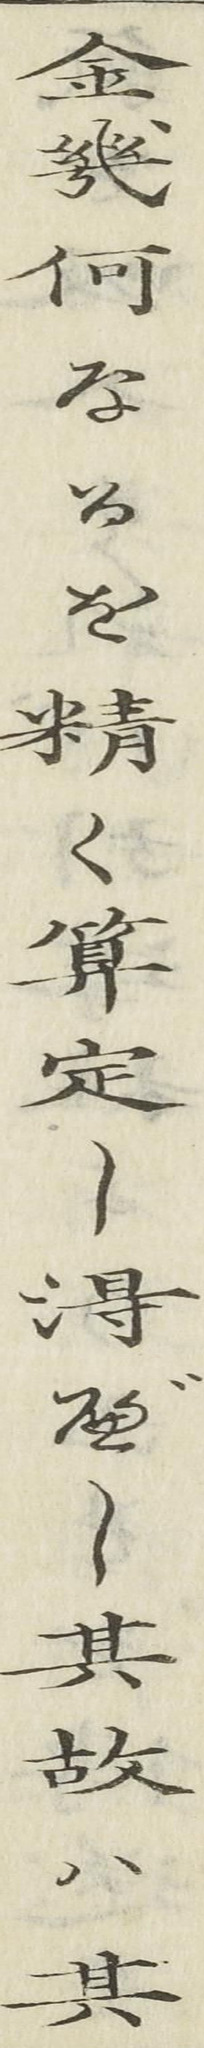金幾何なるを精く算定し得べし其故は其
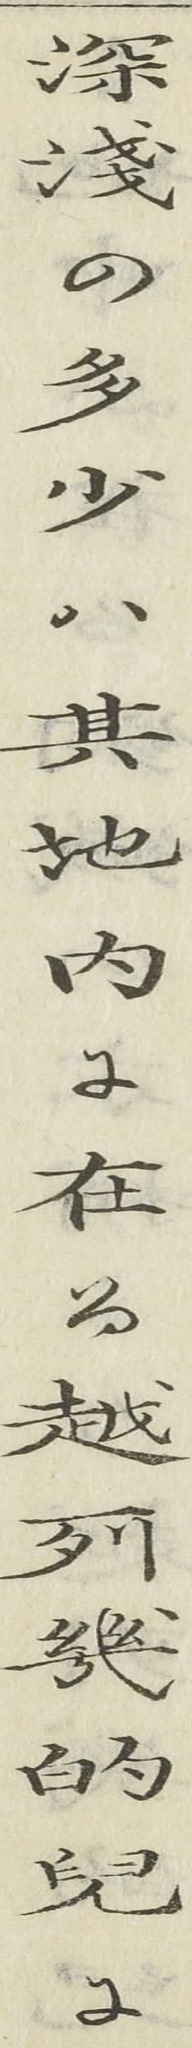深浅の多少は其地内に在る越列幾的児に
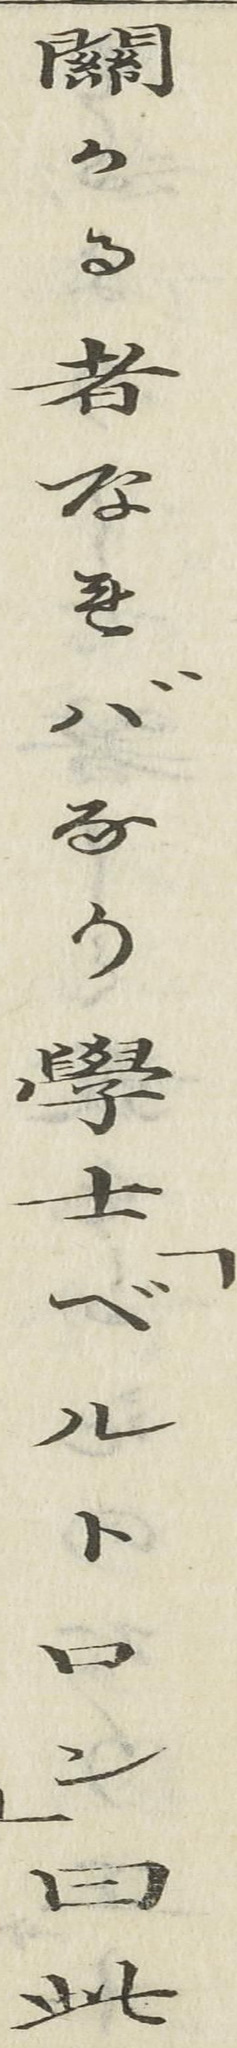関かる者なればなり学士「ベルトロン」曰此
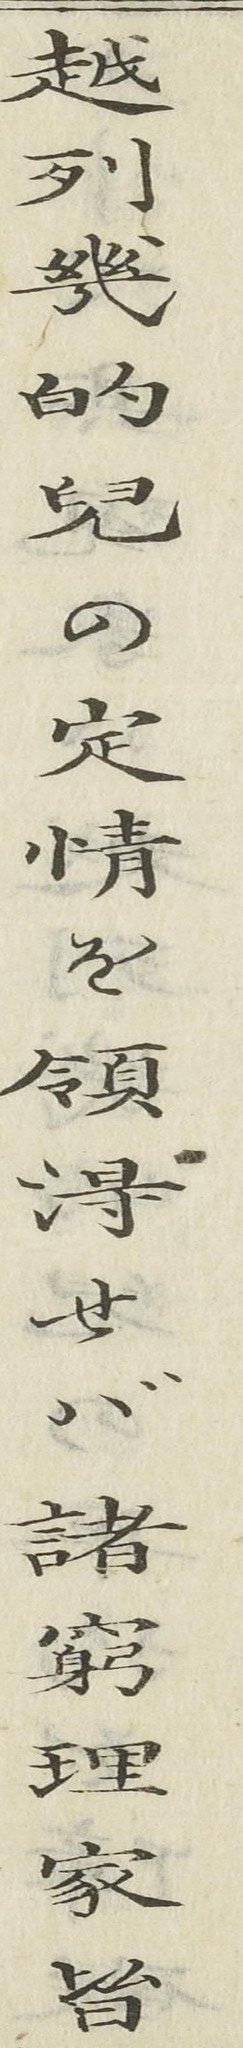越列幾的児の定情を領得せば諸窮理家皆
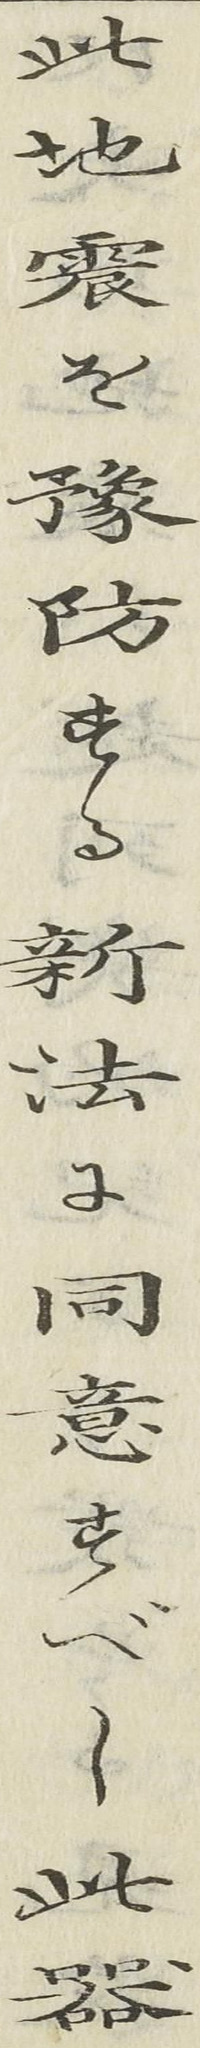此地震を豫防する新法に同意すべし此器
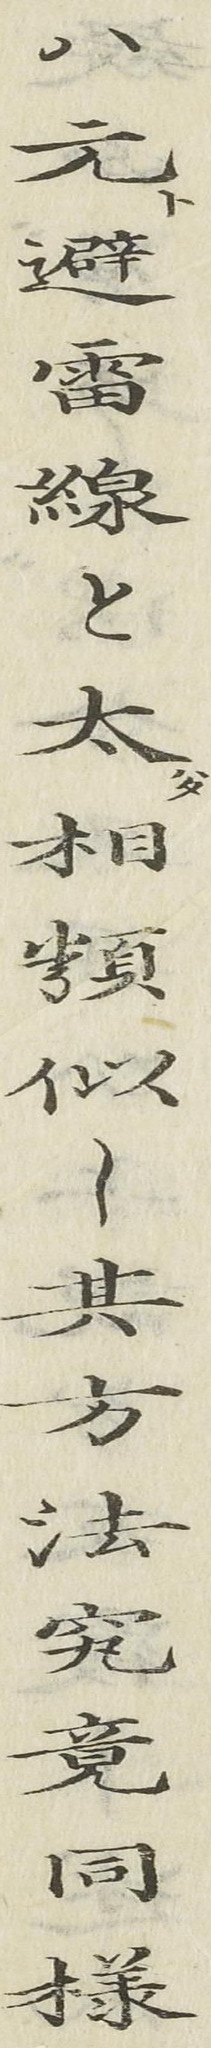は元と避雷線と太はた相類似し其方法究竟同様
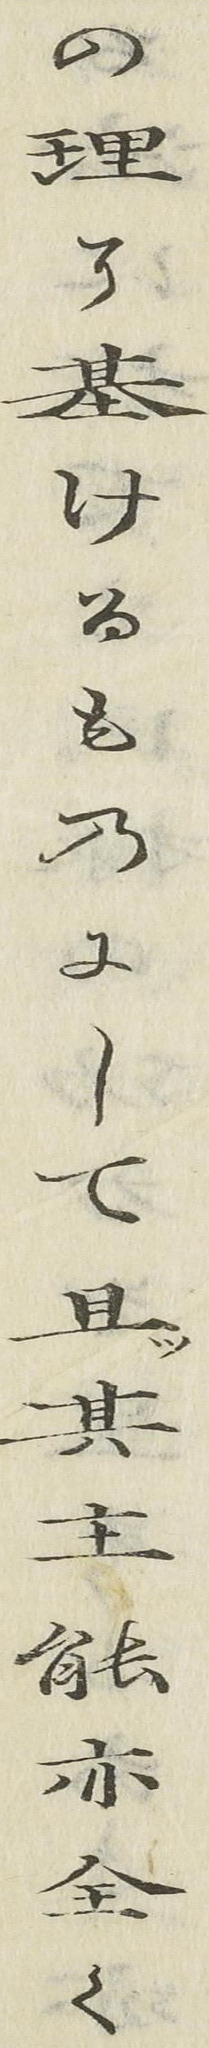の理に基けるものにして且つ其主能亦全く
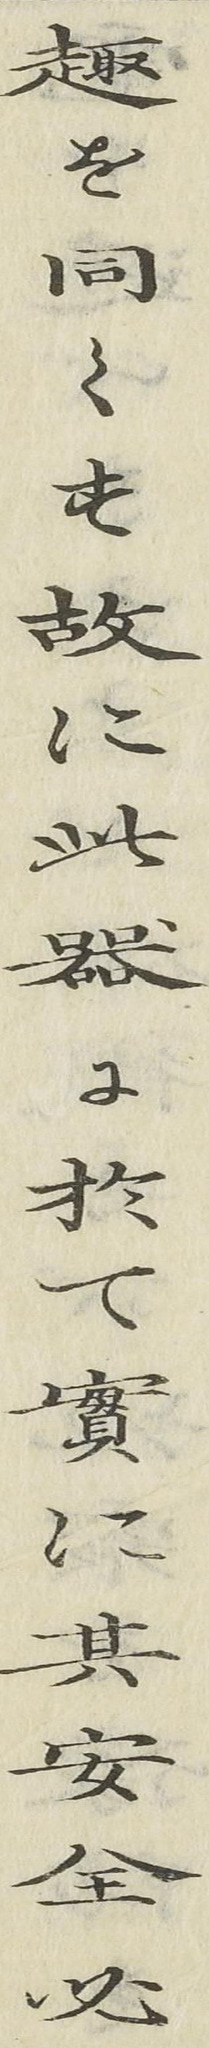趣を同くす故に此器に於て実に其安全必
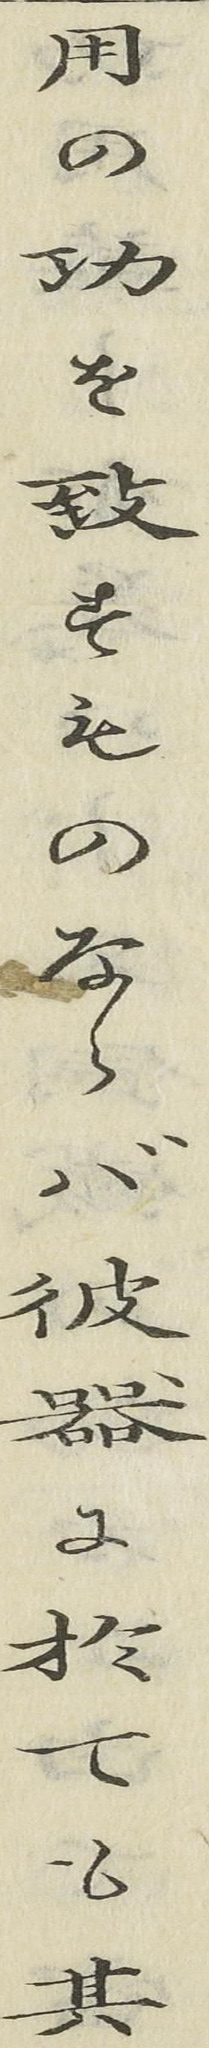用の功を致すものならば彼器に於ても其

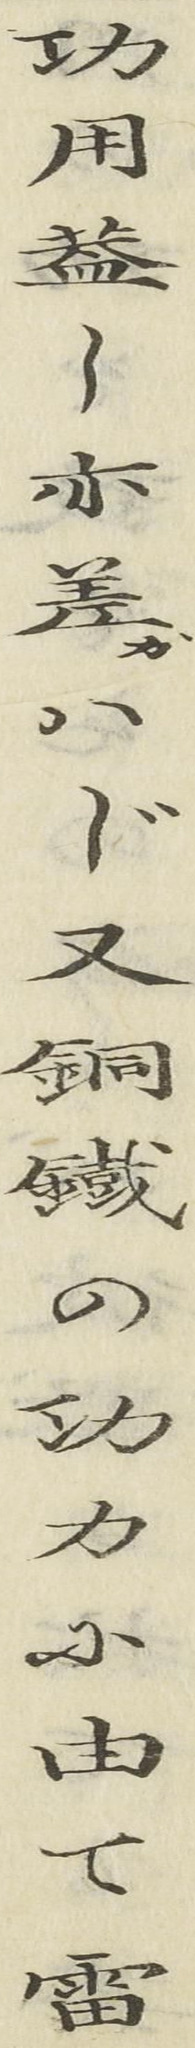功用蓋し亦差又銅鉄の功力に由て雷
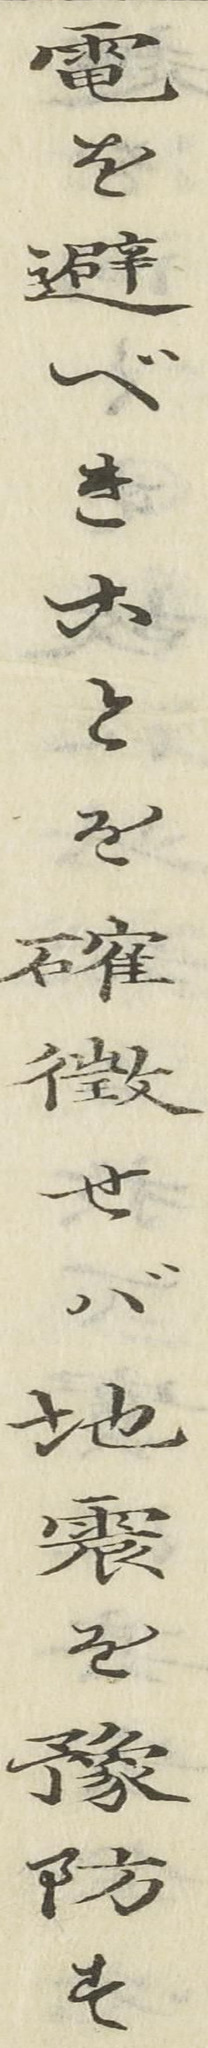電を避べきことを確徴せば地震を予防す
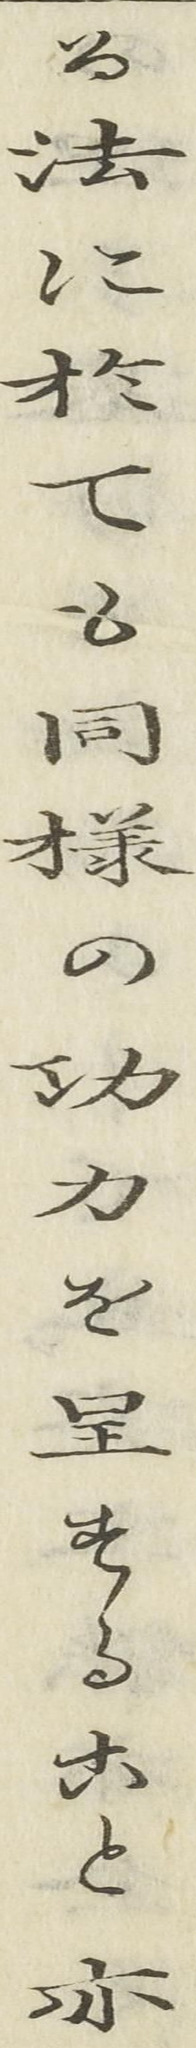る法に於ても同様の功力を呈すること亦
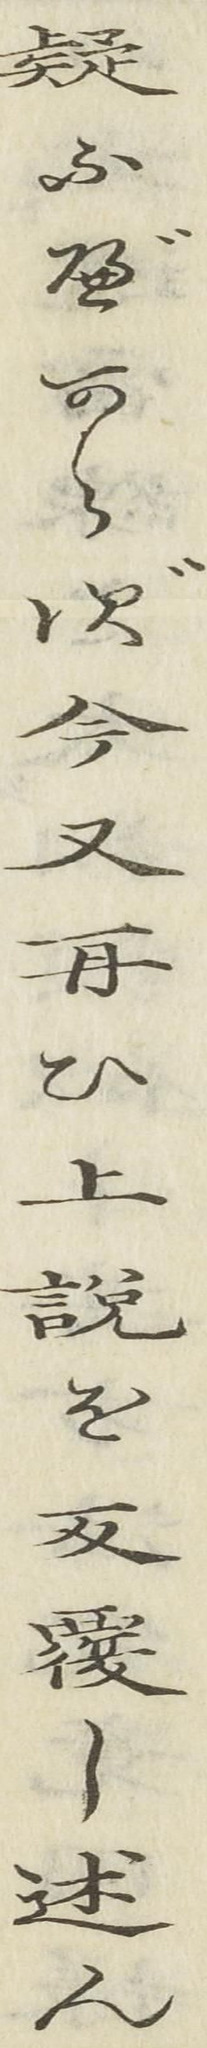疑ふべからず今又再び上説を反覆し述ん
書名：地震預防説
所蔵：東京大学地震研究所図書室 Earthquake Research Institute Library, The University of Tokyo, JAPAN
